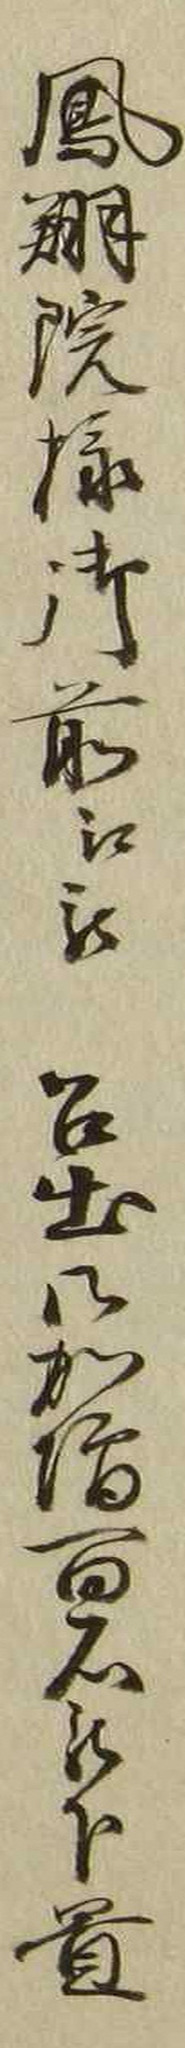鳳翔院様御前江被召出御加増百石被下置
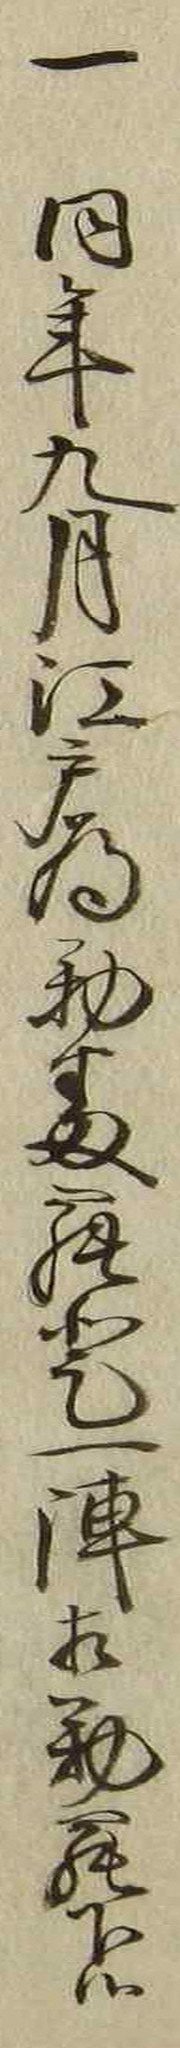一同年九月江戸為勤番罷登一陣相勤罷下候
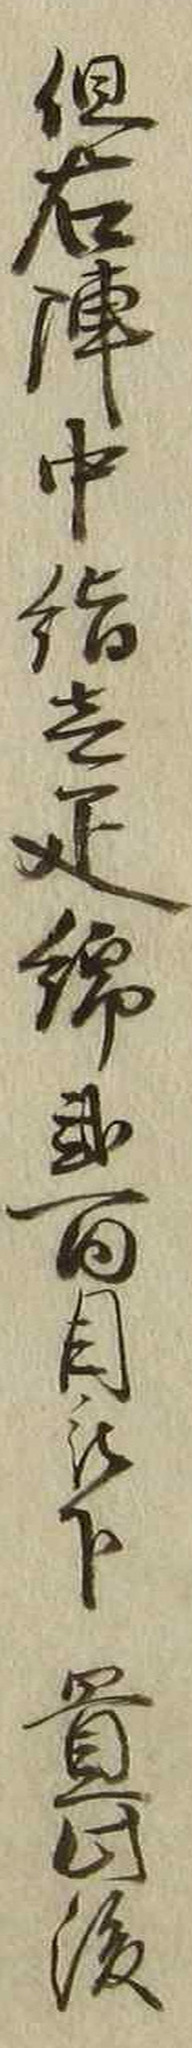但右陣中絹壱疋綿弐百目被下置此後
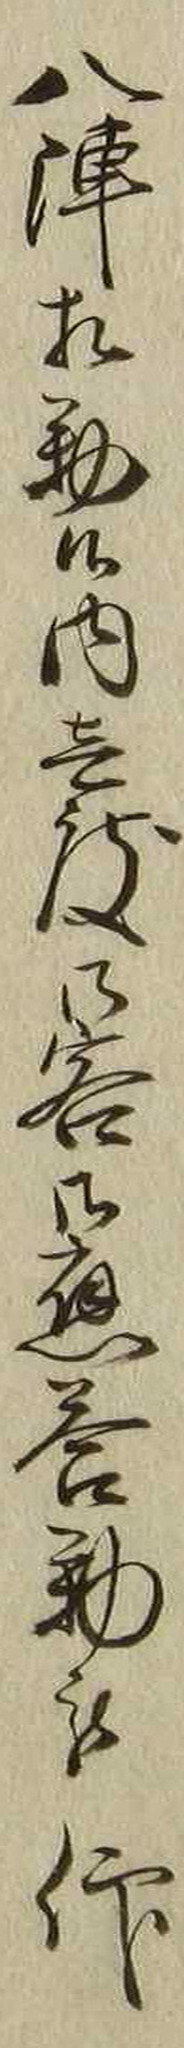八陣相勤候内壱度御客御応答勤被仰
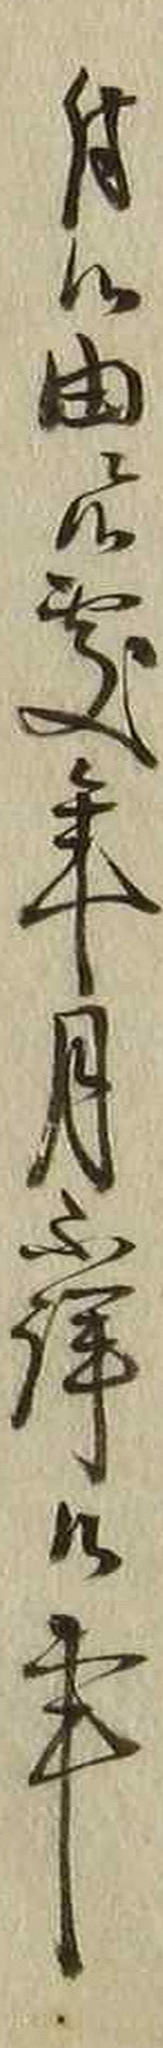付候由ニ候處年月不詳候事
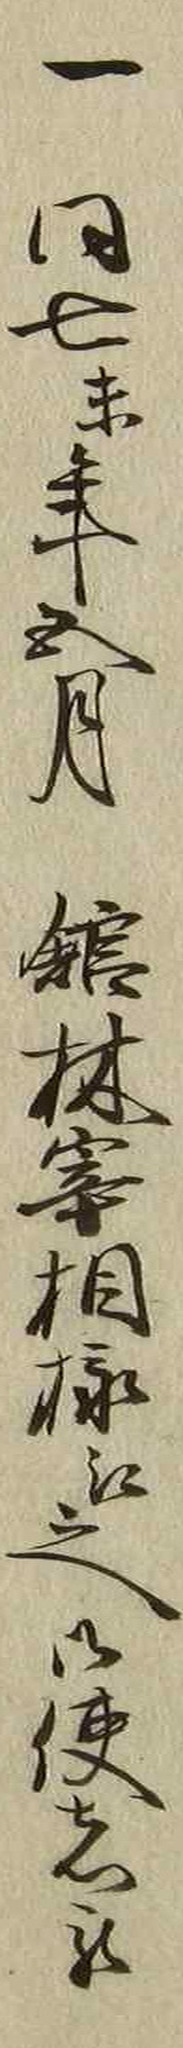一同七未年五月館林宰相様江之御使者被
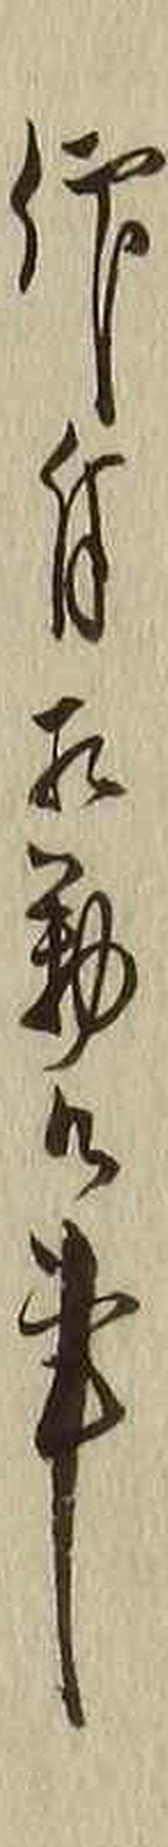仰付相勤候事
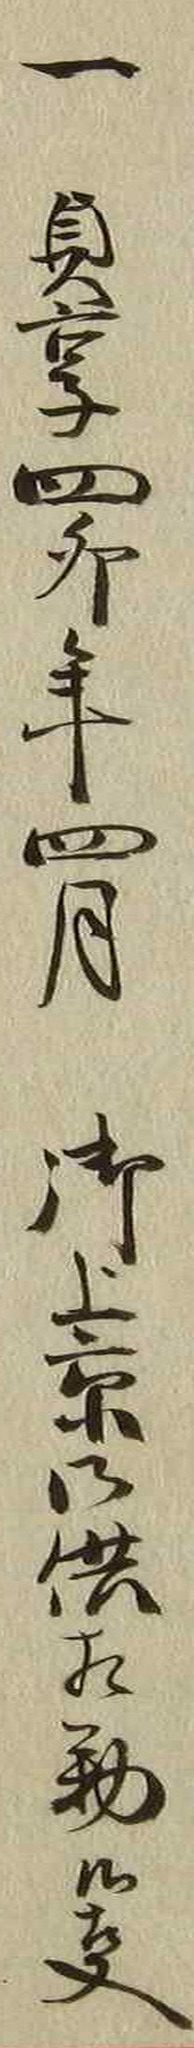一貞享四卯年四月御上京御供相勤候事
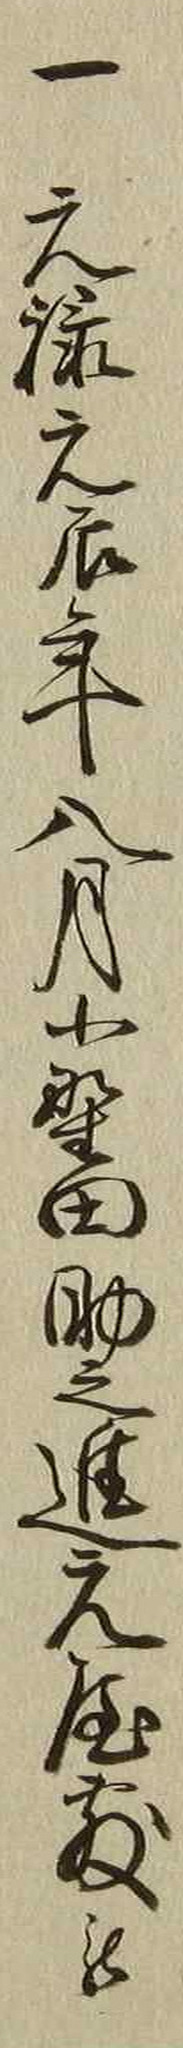一元禄元辰年八月小野田助之進元屋敷被
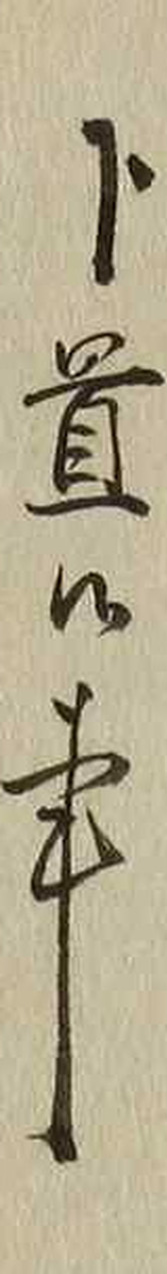下置候事
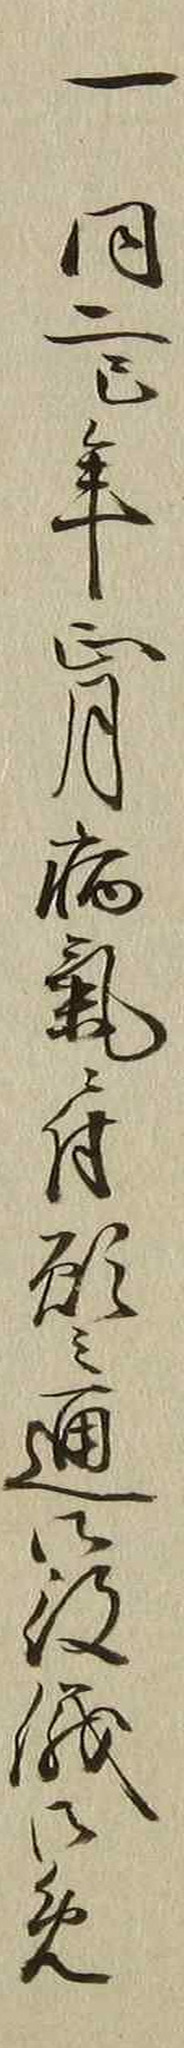一同二巳年正月病気ニ付願之通御役儀ごめ御免
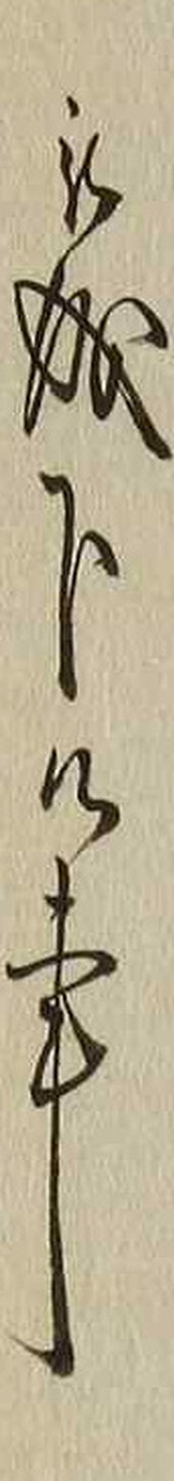被成下候事
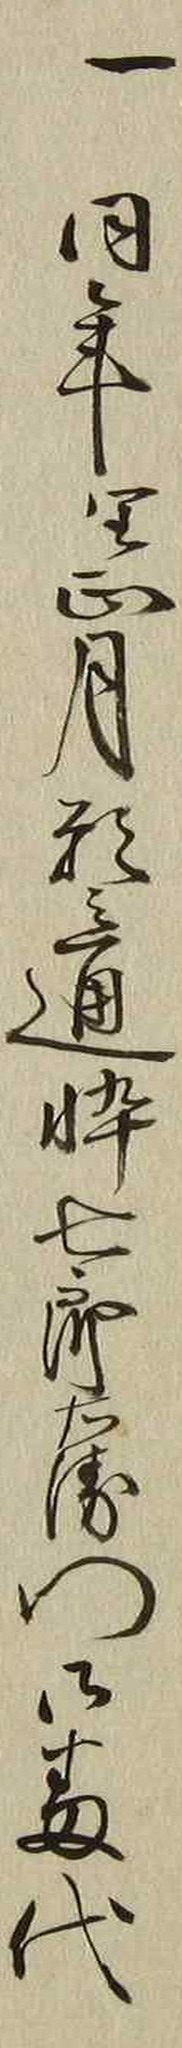一同年閏正月願之通忰七郎右衛門御ｂ番代
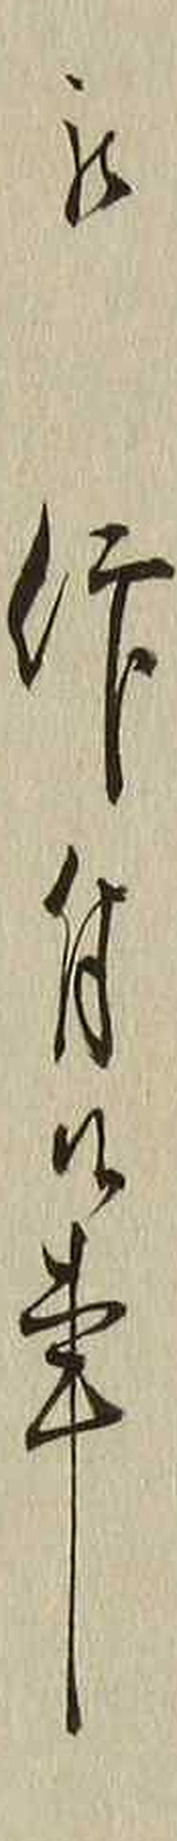被仰付候事
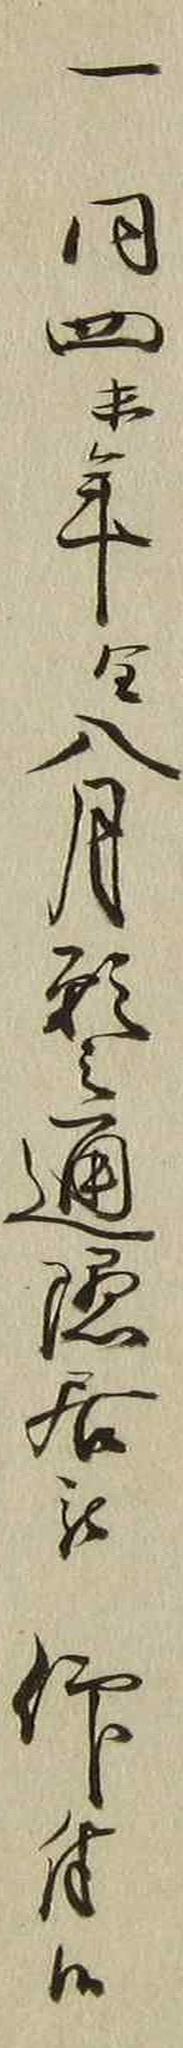一同四未年閏八月願之通隠居被仰付候
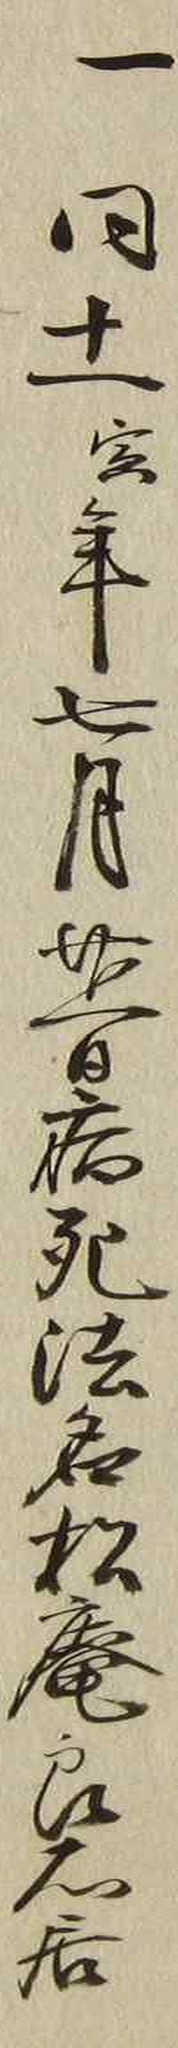一同十一寅年七月廿一日病死法名松庵郎石居
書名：諸士系譜　巻之65　ち之部1
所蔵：会津若松市立会津図書館
